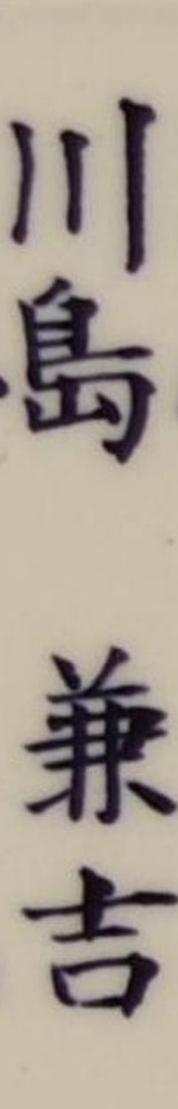川島兼吉
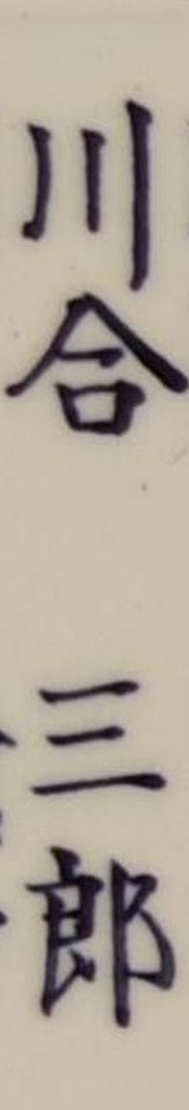川合三郎
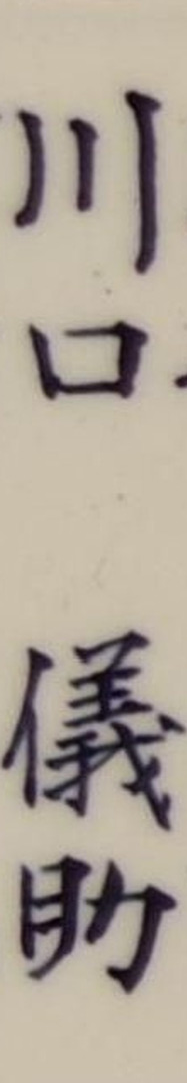川口儀助
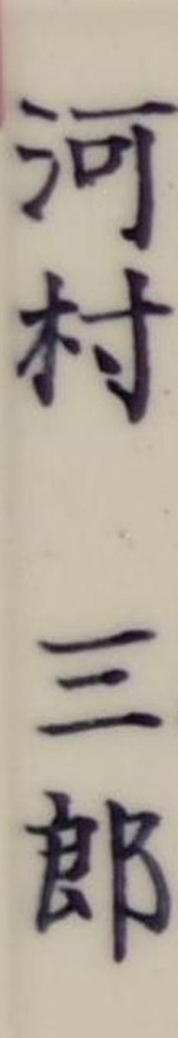河村三郎

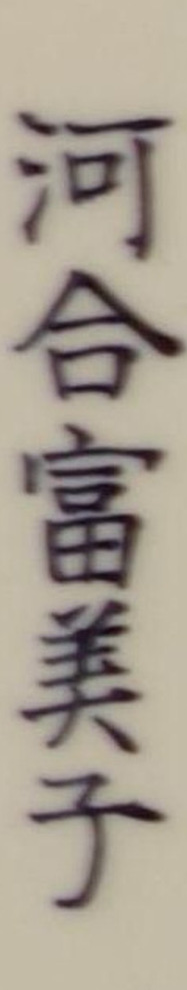河合富美子
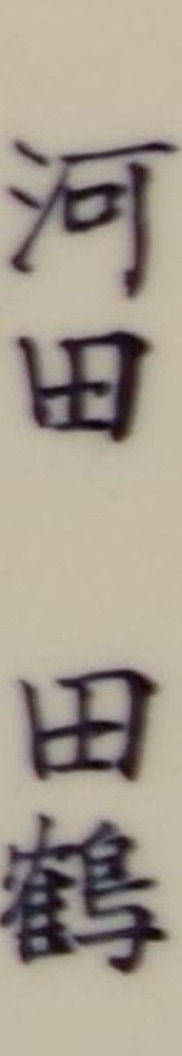河田田鶴
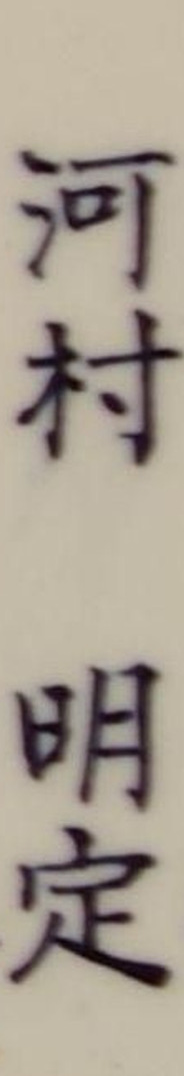河村明定
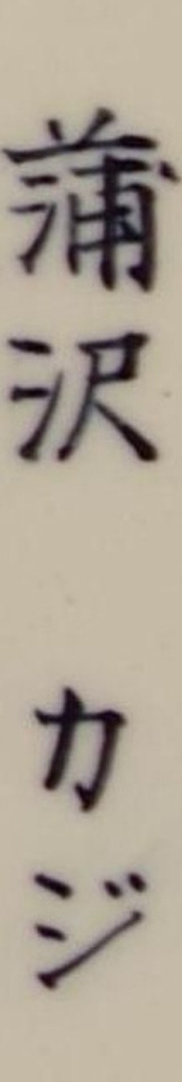蒲沢カジ
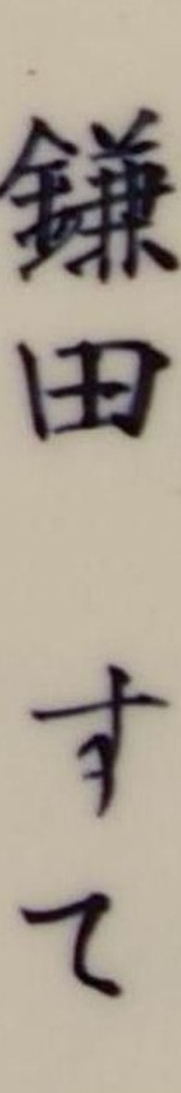鎌田すて
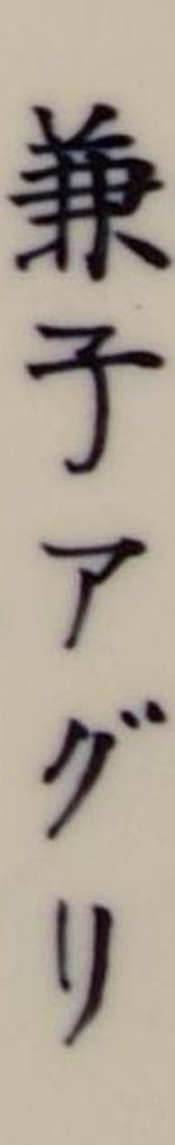兼子アグリ
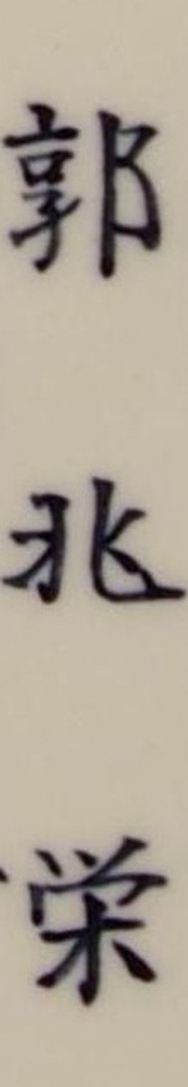郭兆栄
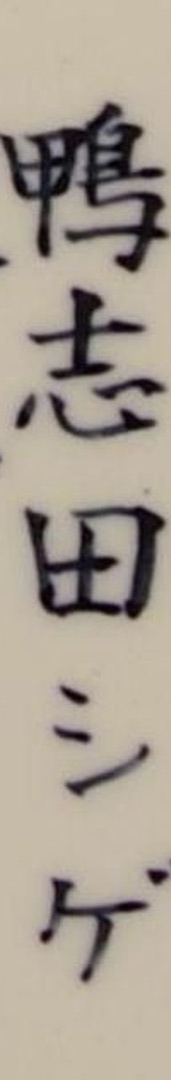鴨志田シゲ
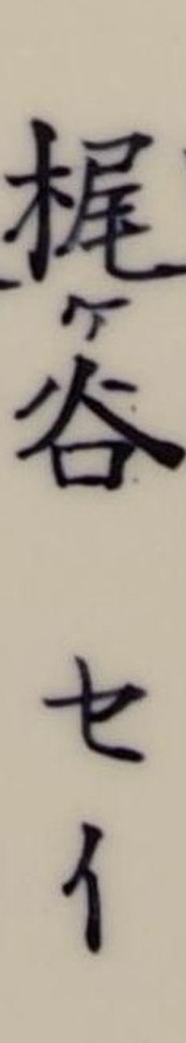梶ヶ谷セイ
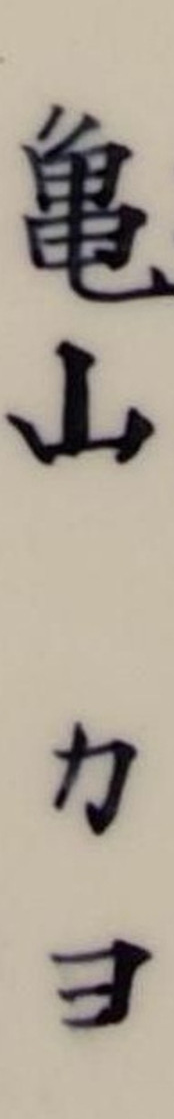亀山カヨ
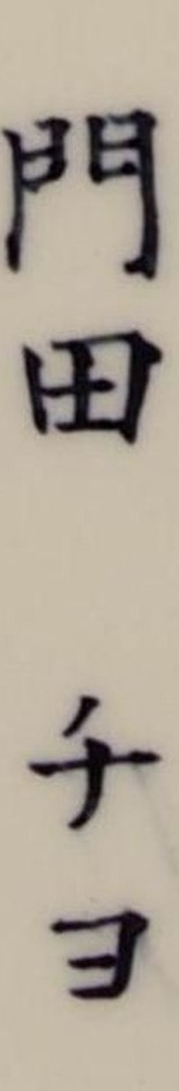門田チヨ
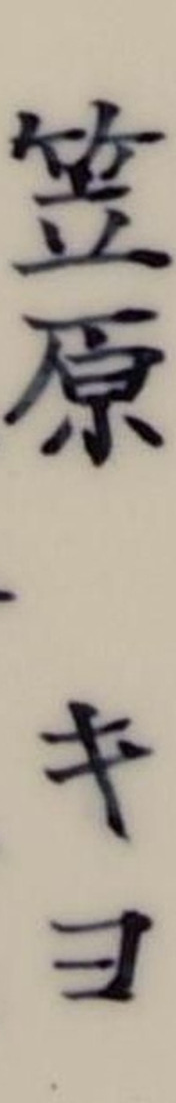笠原キヨ
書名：M~S
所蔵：高野山金剛峯寺
